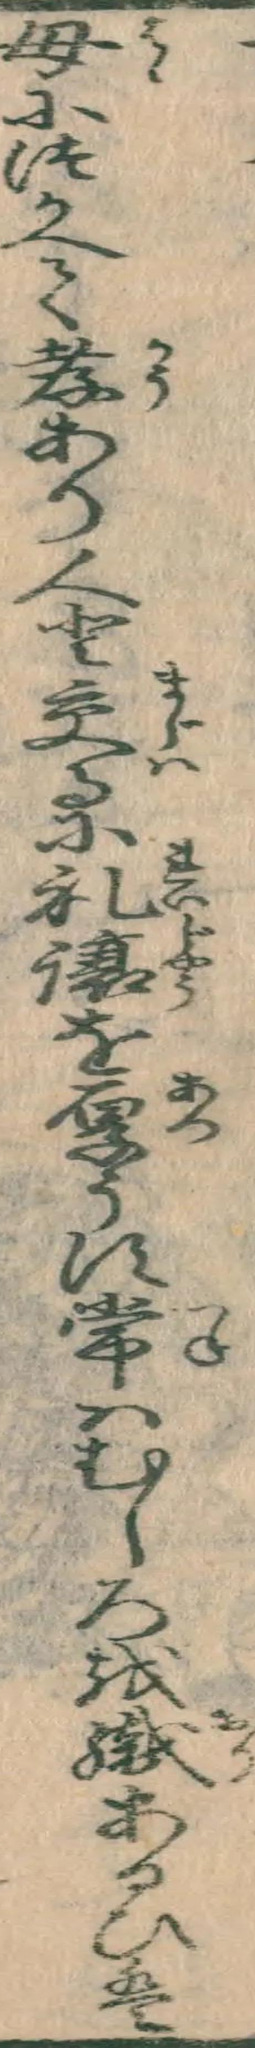母につかへて孝あり人と交るに礼譲を厚うす常はむしろを織あるひは
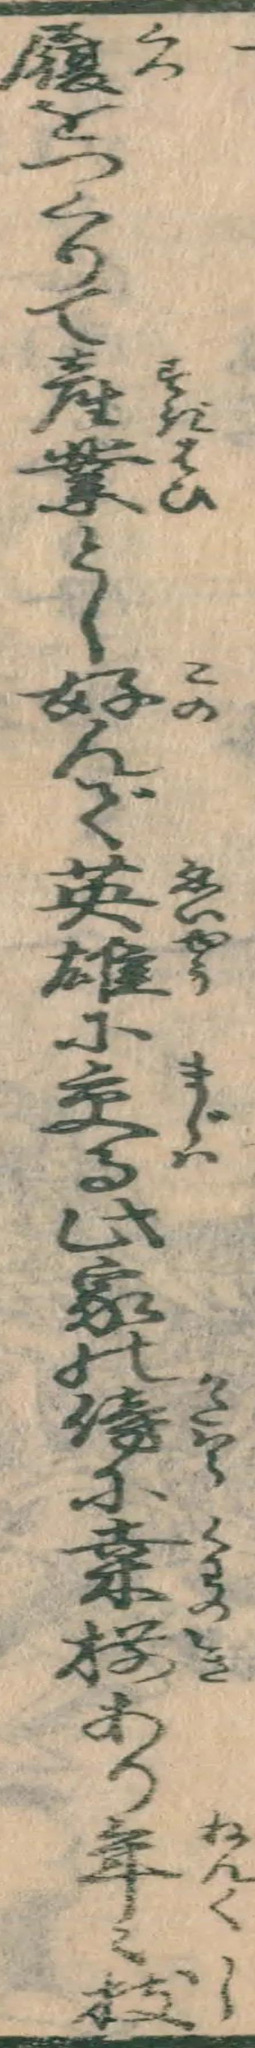履をつくりて産業とし好んで英雄に交る此家の傍に桑樹あり年々枝
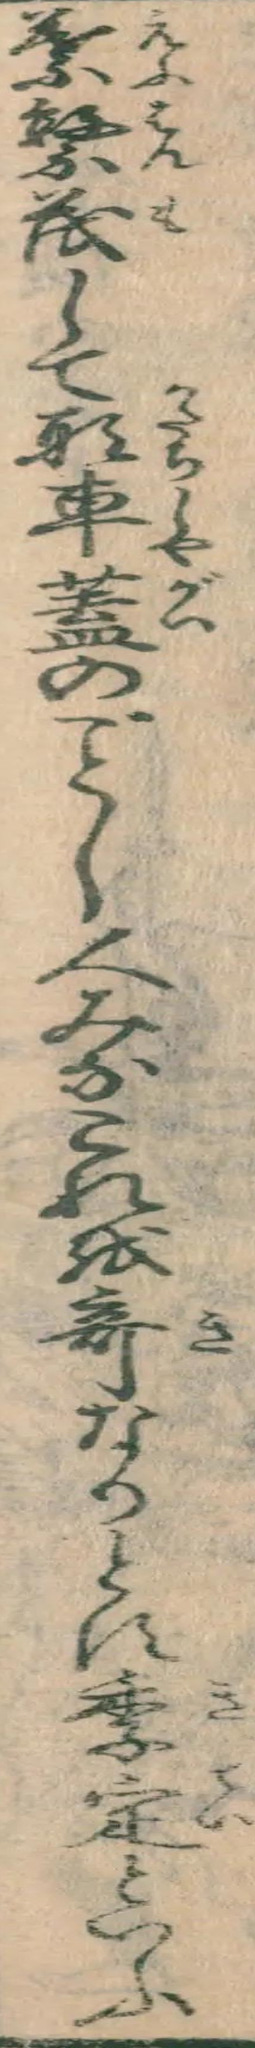葉繁茂して形車蓋のごとし人みなこれを奇なりとす季定といふ
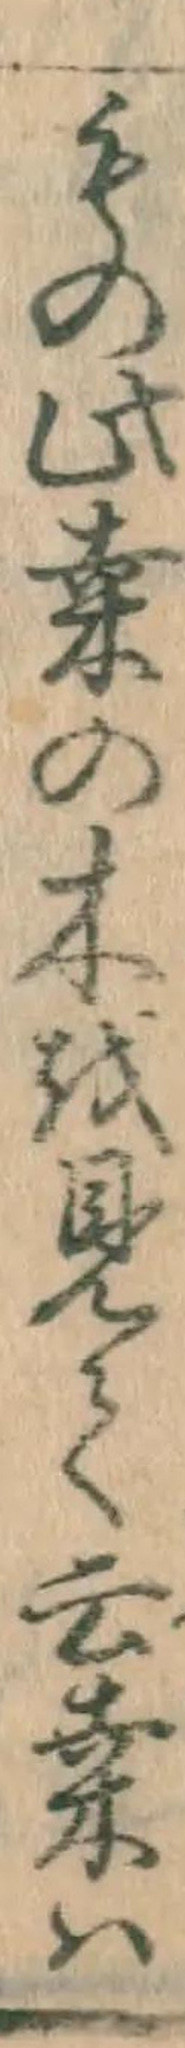もの此桑の木を見て云桑は
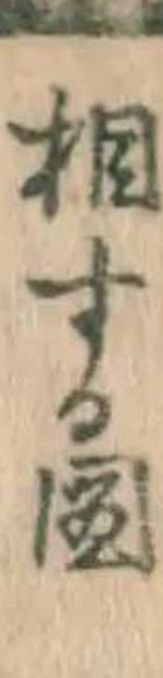相する図
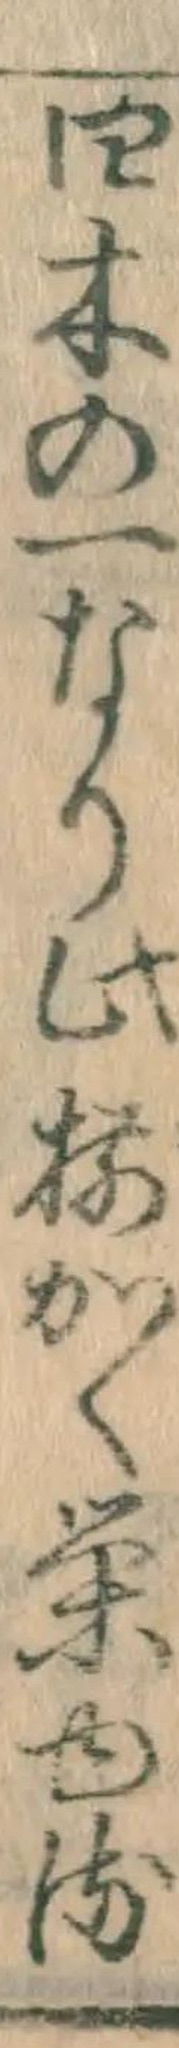四木の一なり此樹かく栄ゆる
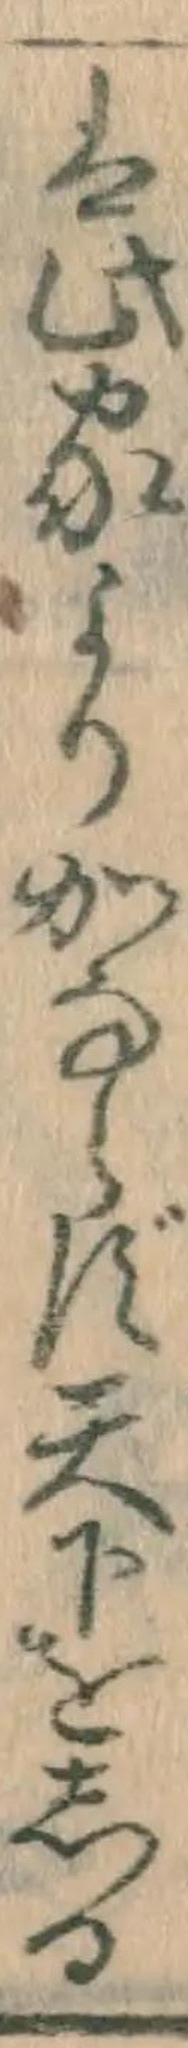は此家よりかならず天下をしる
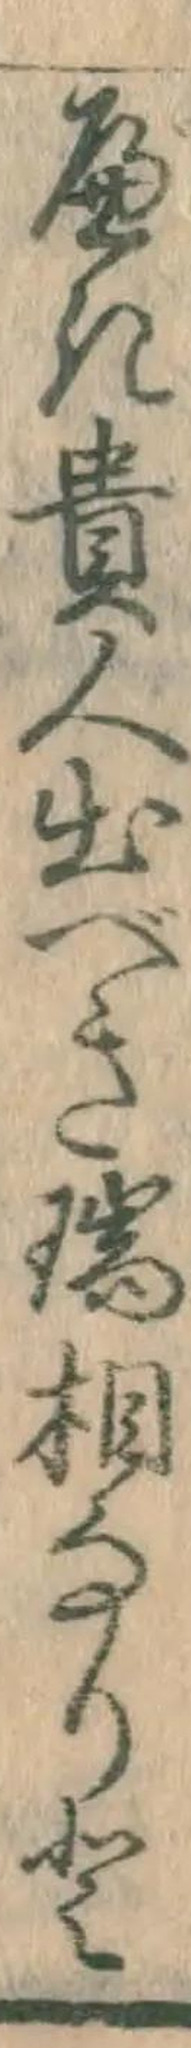べき貴人出べき瑞相なりと
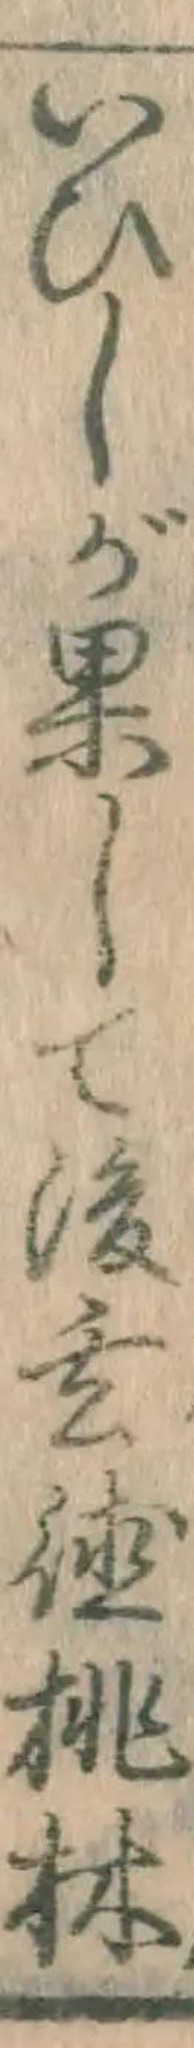いひしが果して後玄徳桃林
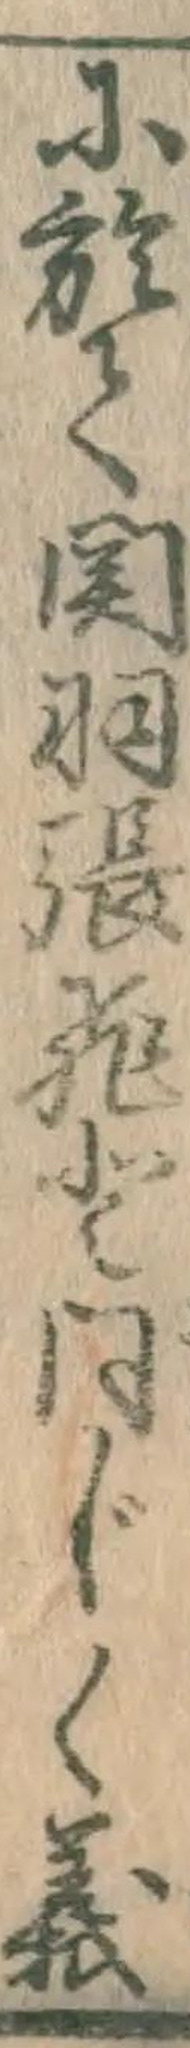に於て関羽張飛と同じく義
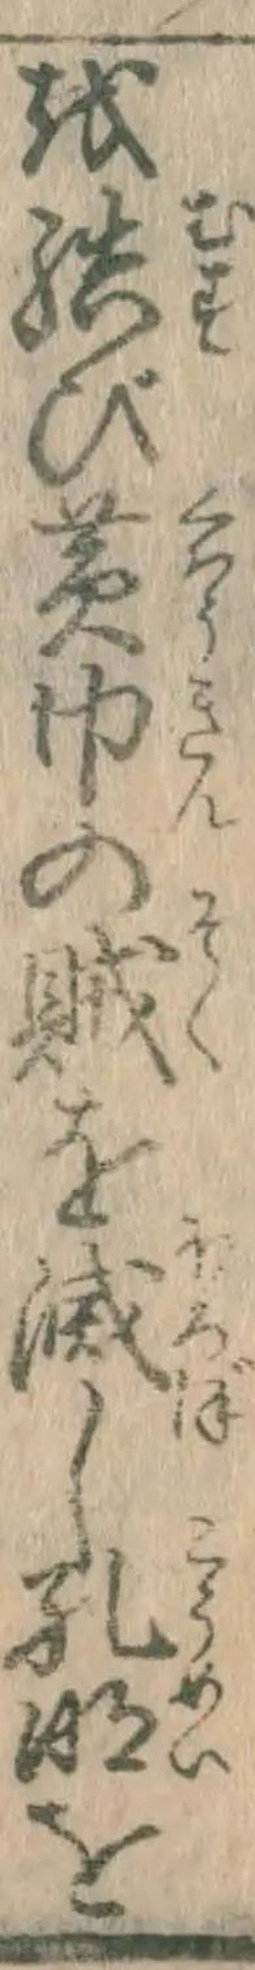を結び黄巾の賊を滅し孔明を
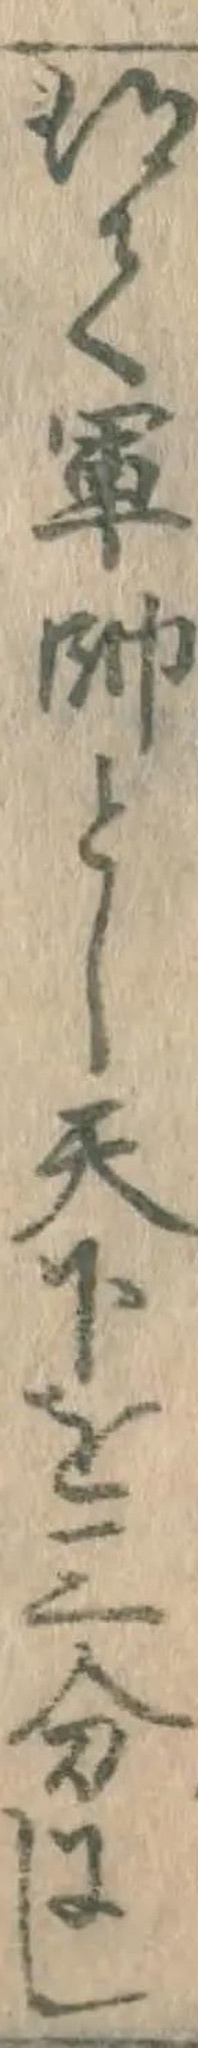得て軍帥とし天下を三分にし
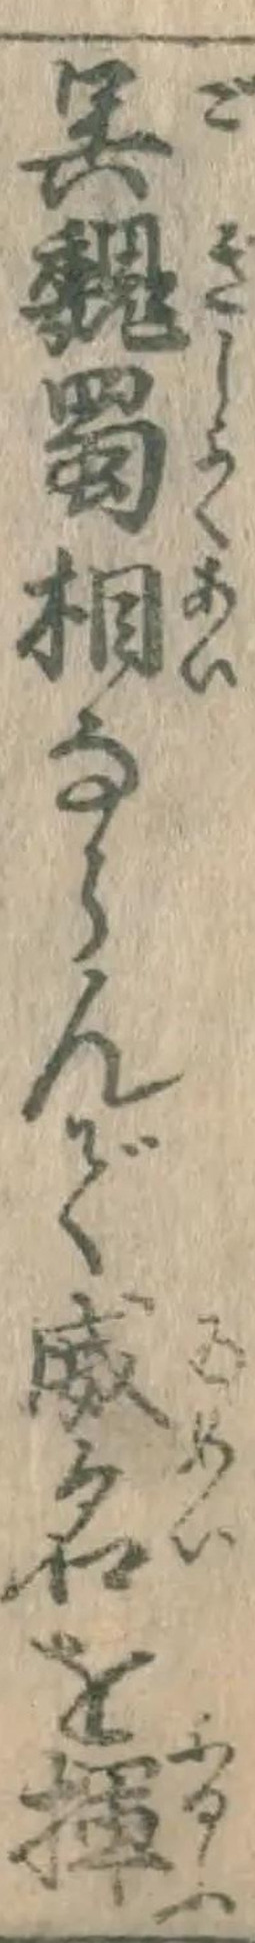呉魏蜀相ならんで威名を揮
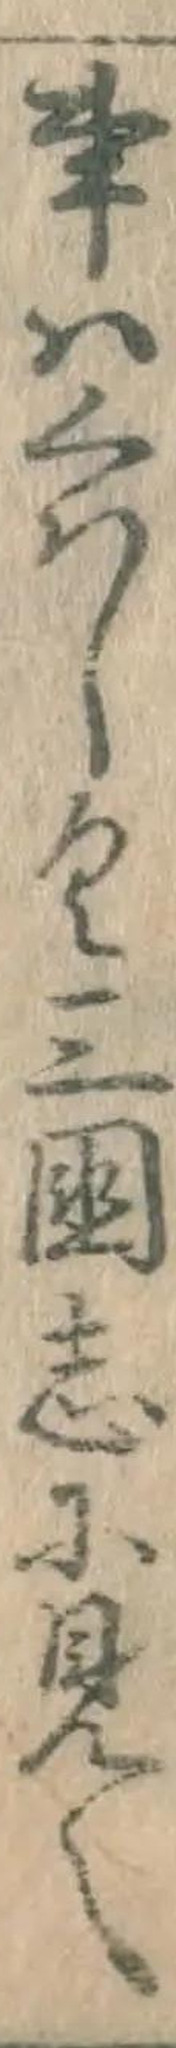事はくはしく三国志に見へ
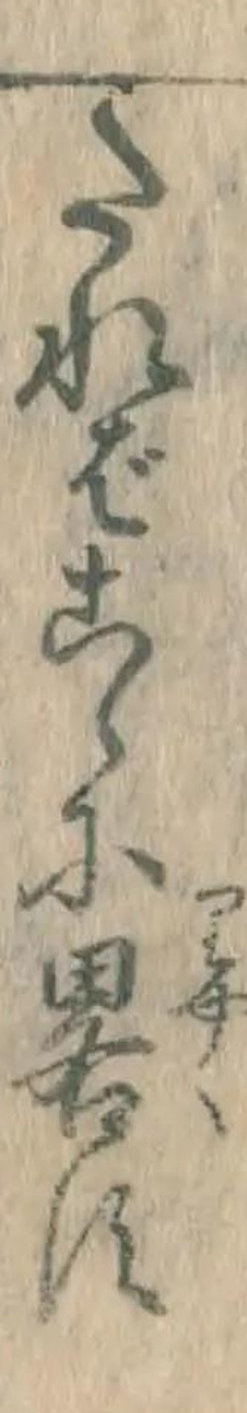たればこゝに略す

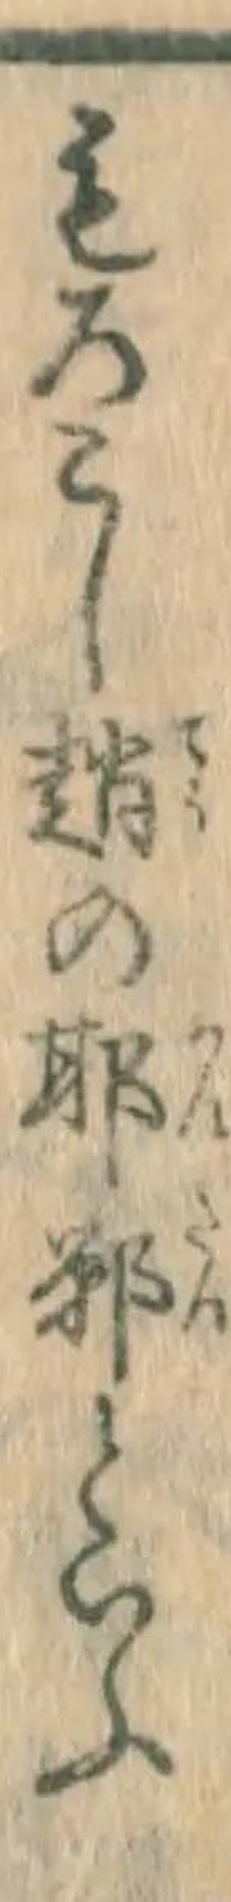もろこし趙の邯鄲といふ
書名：養蚕秘録 3巻. [3]
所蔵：国立国会図書館 National Diet Library, JAPAN
